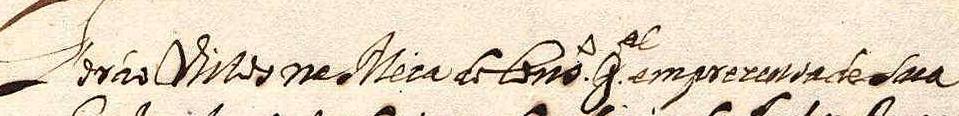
Forão Vistos na Meza do Cons.o G.al em prezensa de sua
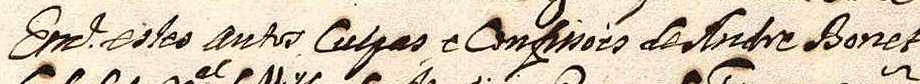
Em.a estes autos, Culpas, e Confissoes de Andre Bonet
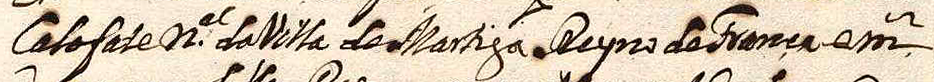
Calafate n.al da Villa de Martiga Reyno de França e m.or
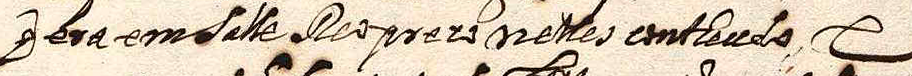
q̄ era em Salle Reo prezo, nelles contheudo, E
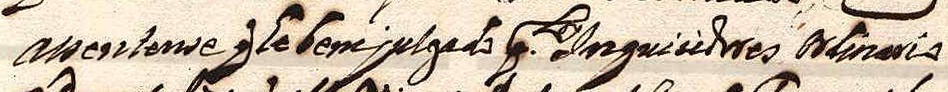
assentouse q̄ he bem julgado p.Los Inquisidores Ordinario
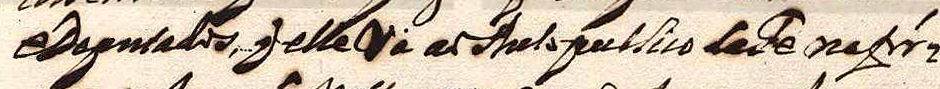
e Deputados, q̄ elle Va ao Auto publico da Fe na for
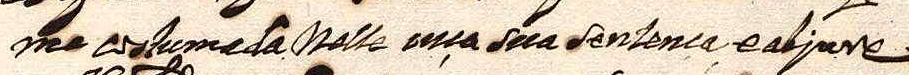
ma costumada nelle ouça sua sentença, e abjure
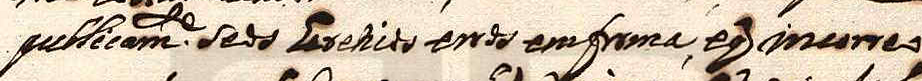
publicam.te seos hereticos erros em forma, e q̄ incorreo
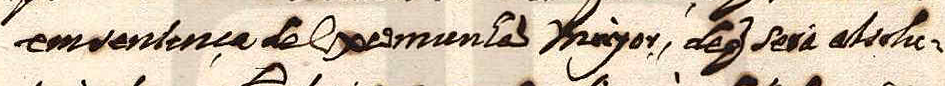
em sentença de Excomunhaõ mayor, de q̄ sera absolu
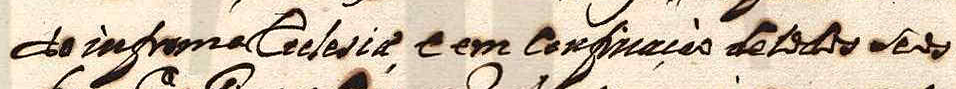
to in froma Ecclesiæ, e em confiscaçaõ de todos seos
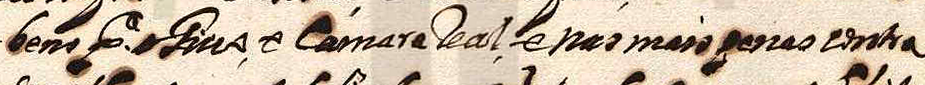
bens p.a o Fisco, e Camara Real, e nas mais penas contra
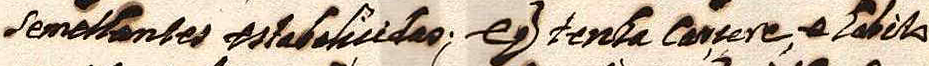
semelhantes estabelicidas; e q̄ tenha carcere, e habito
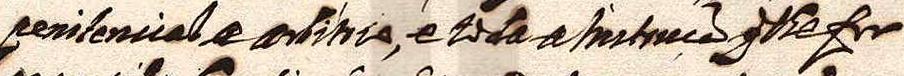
penitencial e arbitrio, e toda a Instruçaõ q̄ lhe for
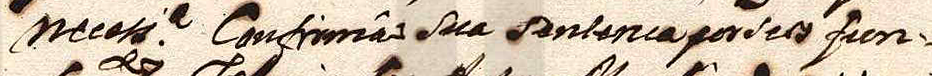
necess.a Confirmaõ sua sentença por seos fun
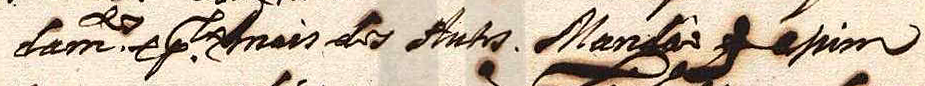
dam.tos e p.Lo mais dos Autos. Mandão q̄ assim
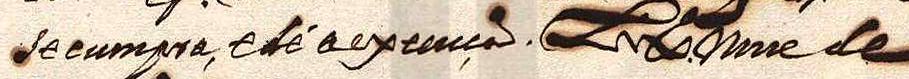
se cumpra, e dé a execuçaõ. Lix.a noue de
